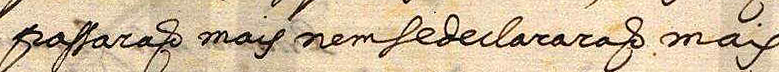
passaraõ mais nem se declararaõ mais
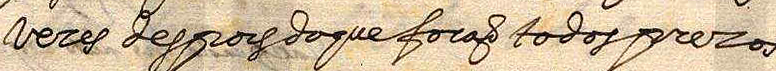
vezes despois do que foraõ todos prezos
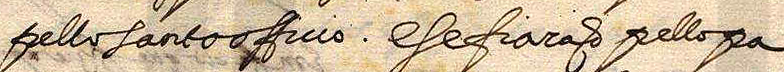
pello santo officio. e se fiaraõ pello pa
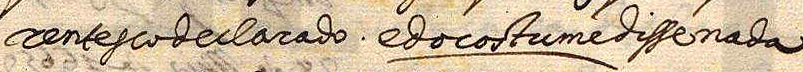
rentesco declarado. e do costume disse nada
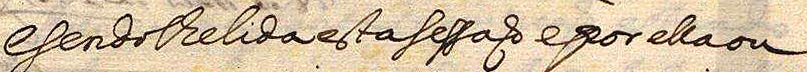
e sendolhe lida esta sessaõ e por ella ou
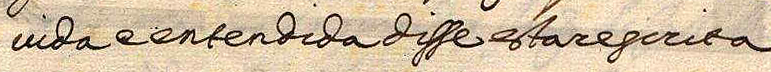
uida e entendida disse estar escrita
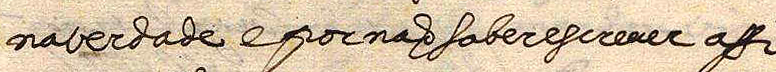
na verdade e por naõ saber escreuer assi
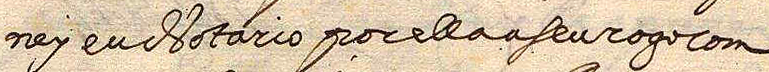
ney eu Notario por ella a seu rogo com
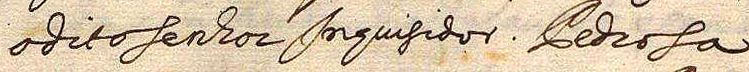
o dito Senhor Jnquisidor. Pedro Sa
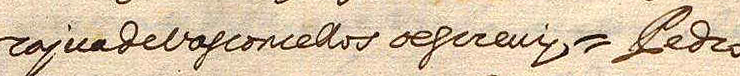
rajua de vasconcellos o escreuy = Pedro
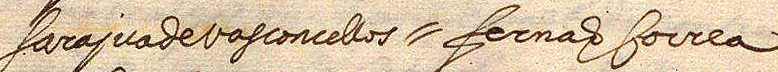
Sarajua de vasconcellos = fernaõ Correa
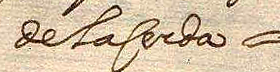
de LaCerda =
